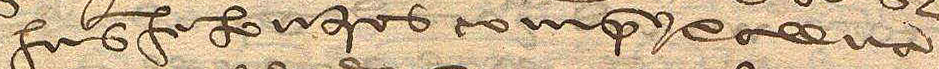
hus̄ he houtros comp̄y e all nā
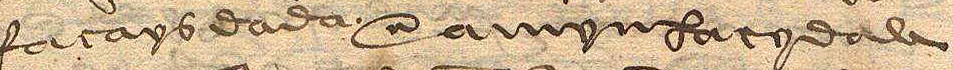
façays dada. ē a mynha cydade
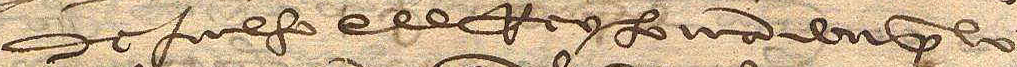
de Julho ell Rey ho mādoy p̄lo
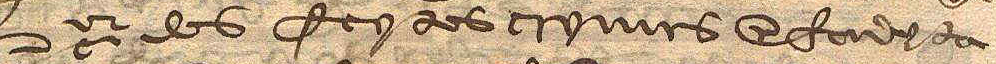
e cor dos feytos crymes ē ha dyta
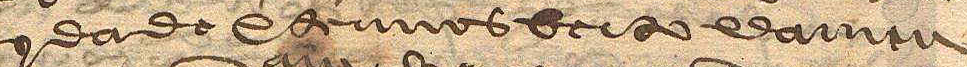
cydade e termos bertolllameu
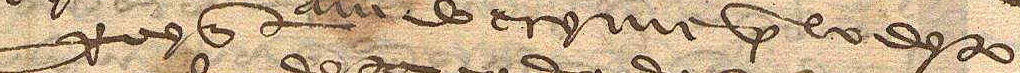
Royz̄ tam do cryme p̄lo dyto
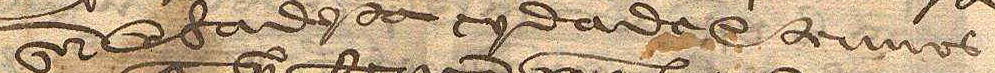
s̄or ē ha dyta cydade e termos
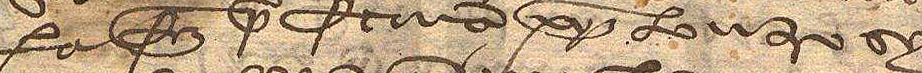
ha fez p̄o fernā p̄yz houtrosy
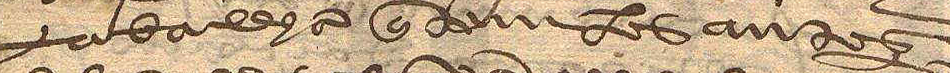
taballyā q̄ tem hos autos
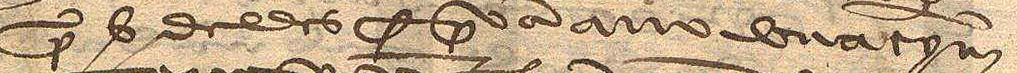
p̄o ꞩ delles sp̄vā ano do nacymto
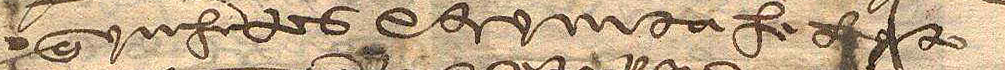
e q̄ynhētos e trymta he hoyto
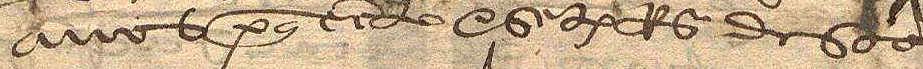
anos p̄g cēto e setꝭ Rs desta
